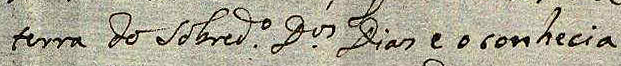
terra do sobred.o D.os Dias e o conhecia
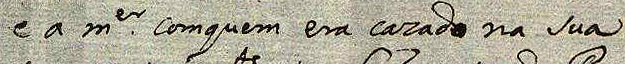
e a me.r com quem era cazado na sua
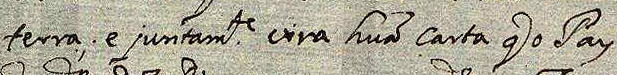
terra; e juntam.te vira huā carta q̄ o Pay
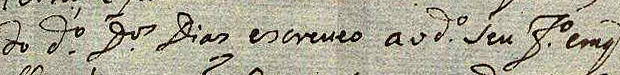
do d.o D.os Dias escreueo ao d.o seu f.o em q̄
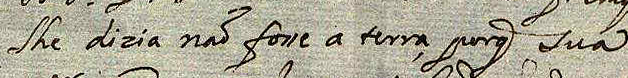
lhe dizia naõ fosse a terra, porq̄ sua
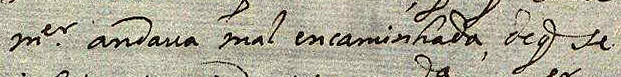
mer. andaua mal encaminhada, de q̄ se
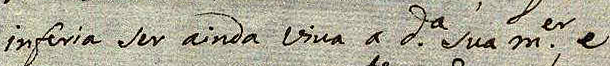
inferia ser ainda viua a d.a sua me.r, e
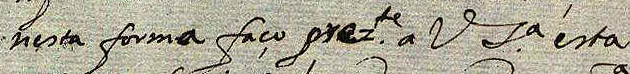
nesta forma faço prez.te a V S.a esta
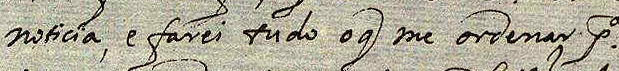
noticia, e farei tudo o q̄ me ordenar p.a
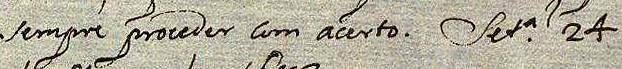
sempre proceder com acerto. Seta.l 24
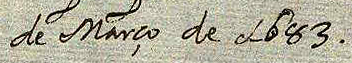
de Março de 1683.
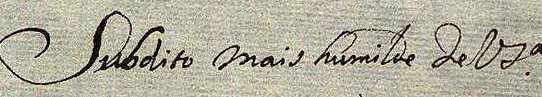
Subdito mais humilde de V S.a
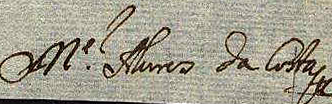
Me.l Nunes da Costa
